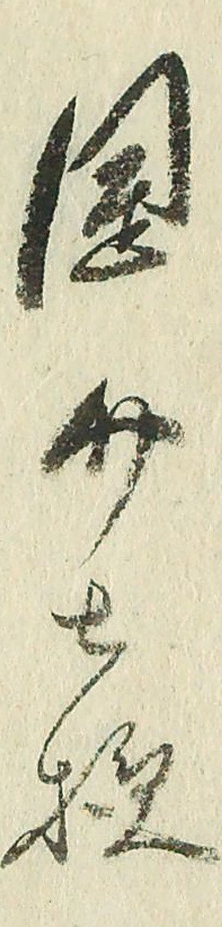岡竹七様
